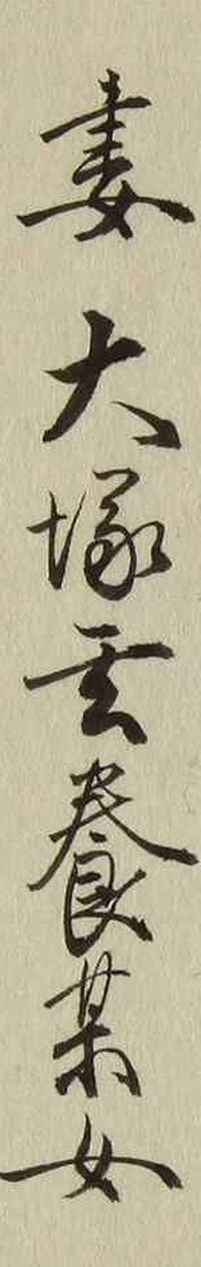妻大塚玄養某女
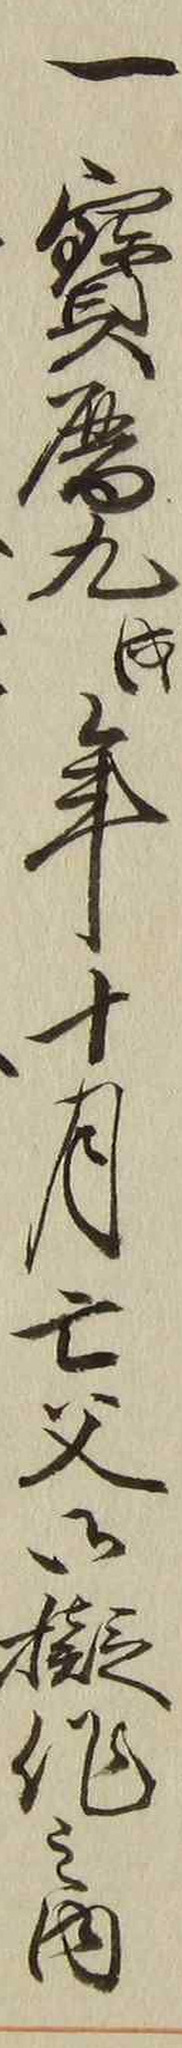一宝暦九戌年十月亡父御擬作之内
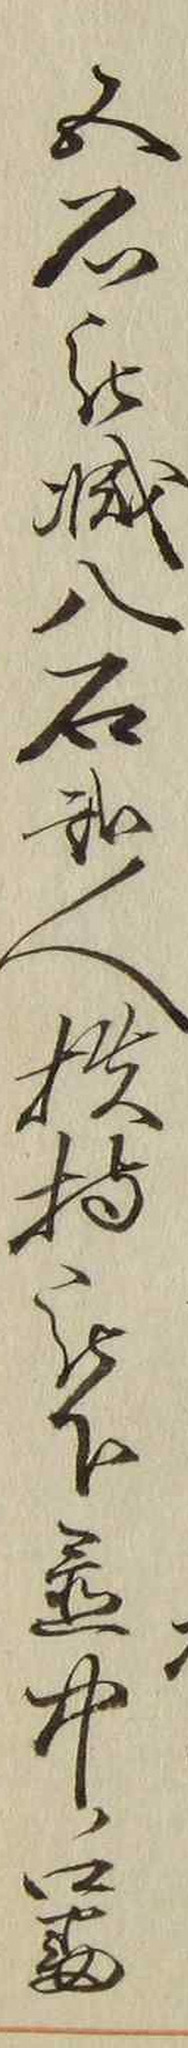五石被減八石弐人扶持被下置中ノ口番
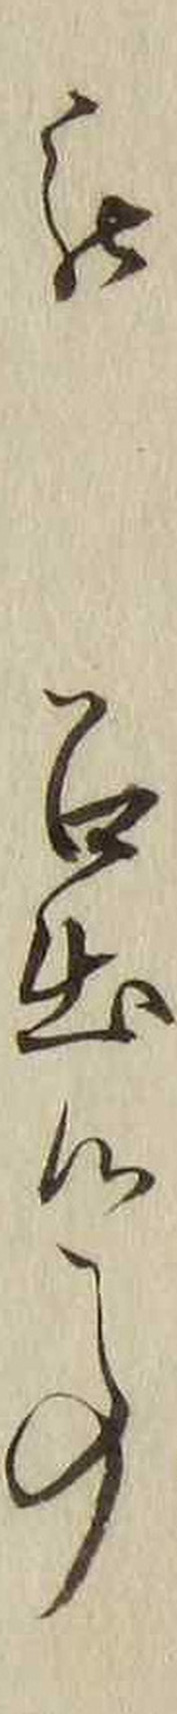被召出侯事
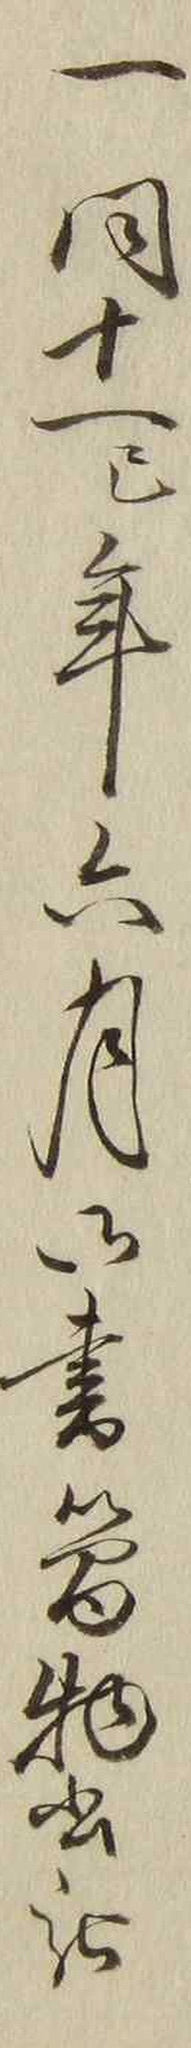一同十一巳年六月御書簡物書被

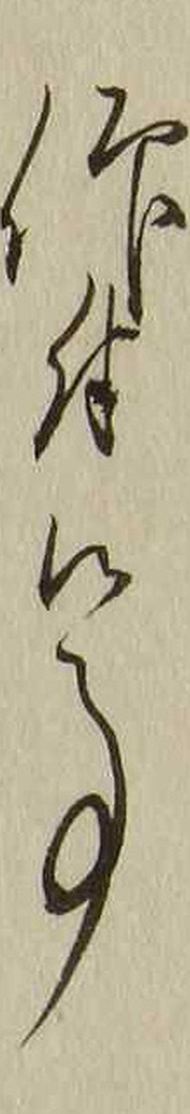仰付候事
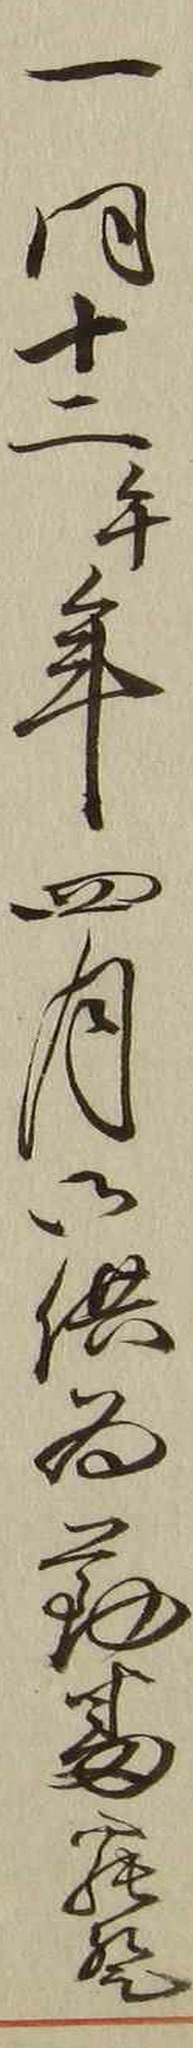一同十二午年四月御供為勤番罷登
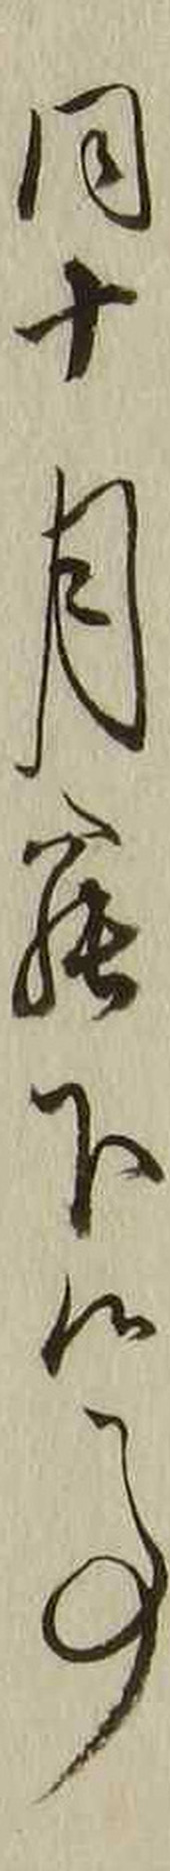同十月罷下候事
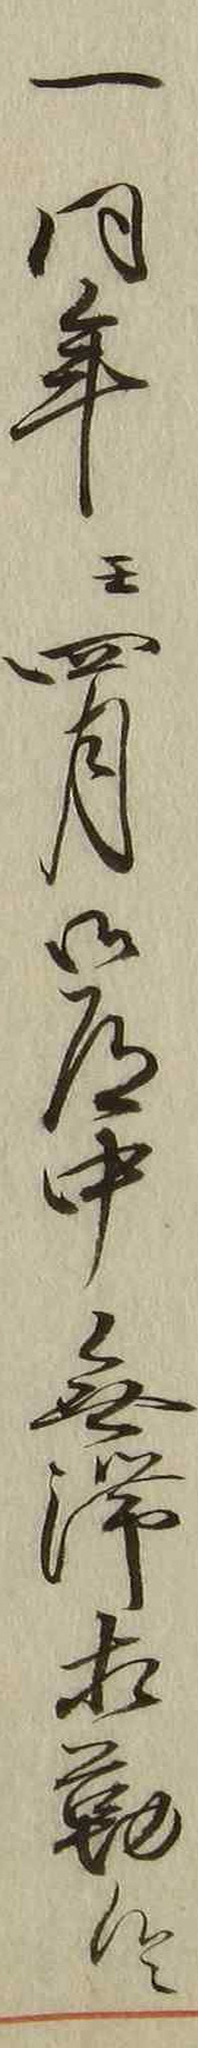一同年閏四月御道中無滞相勤候ニ
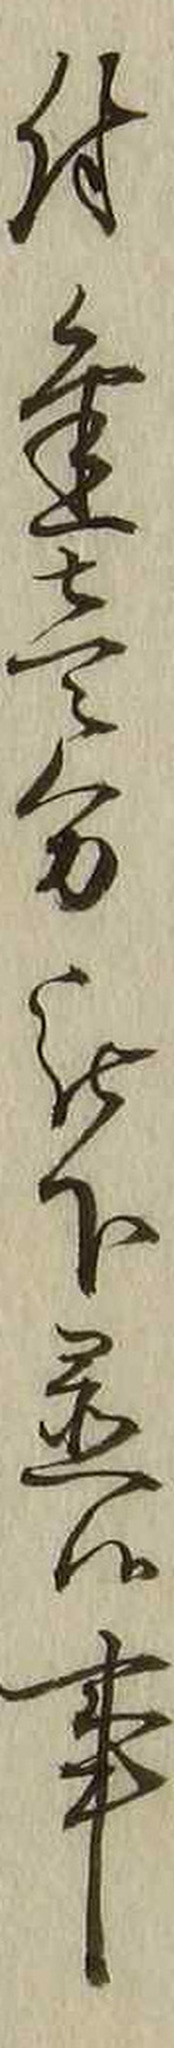付金壱分被下置候事
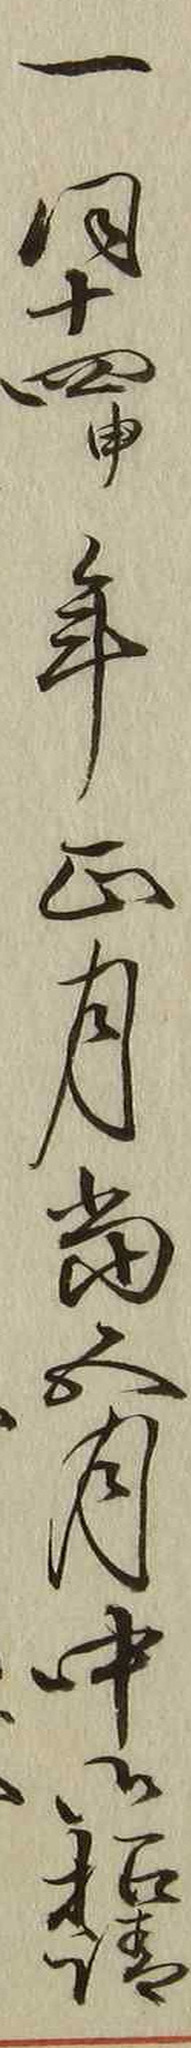一同十四申年正月当五月中御招請
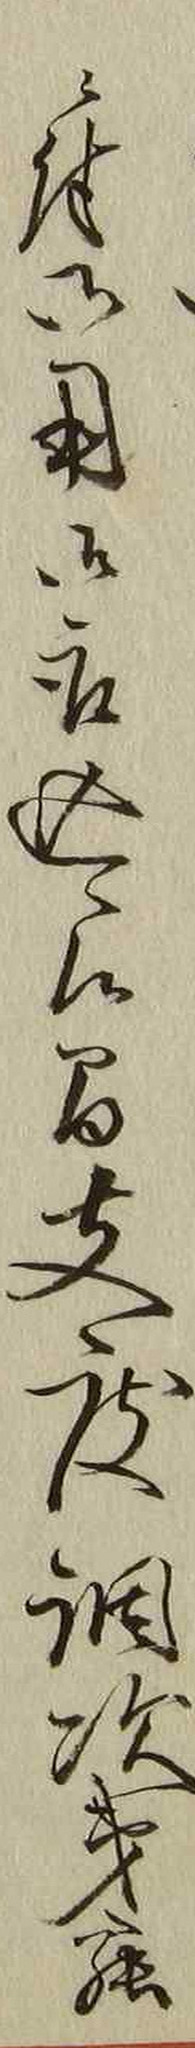ニ付御用御取込ニ候間支度調次第罷
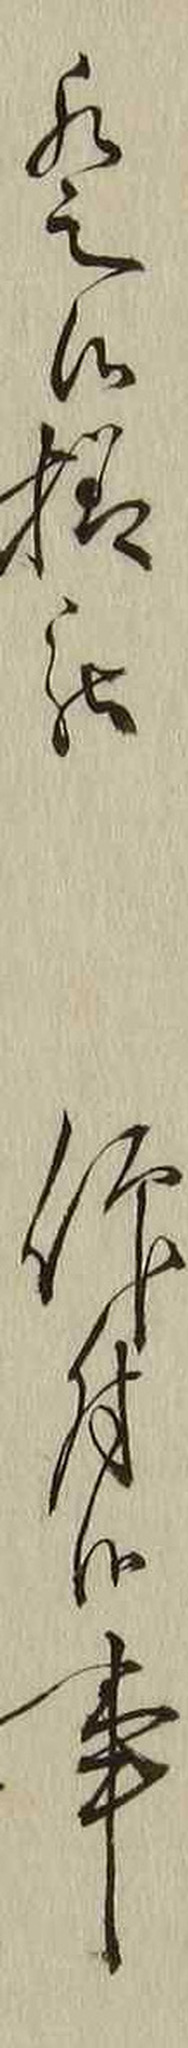登候様被仰付候事
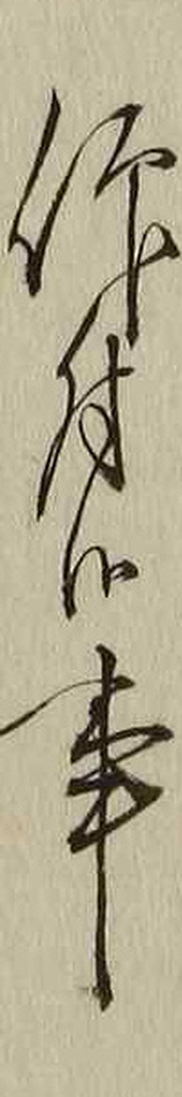仰付候事
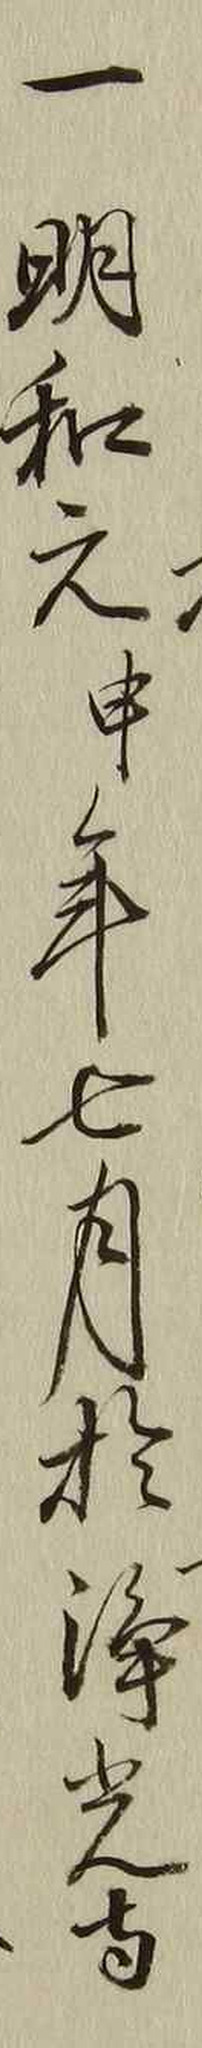一明和元申年七月於浄光寺
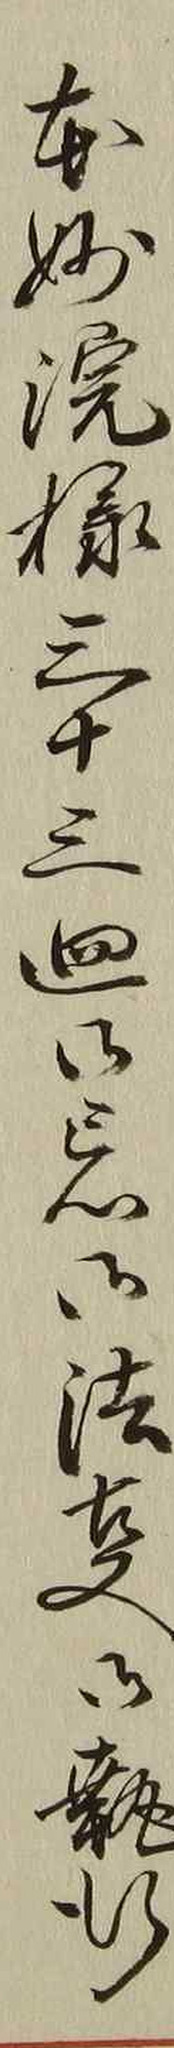本妙院様三十三廻御忌御法事御執行
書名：諸士系譜　巻之57　ほ之部4
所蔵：会津若松市立会津図書館
